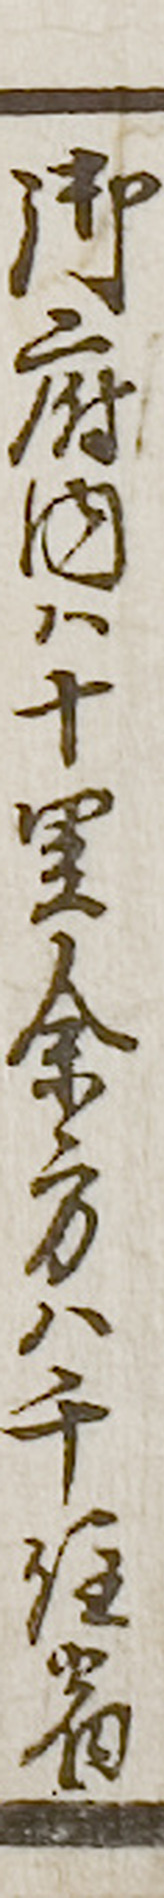御府内ハ十里余方八千住居
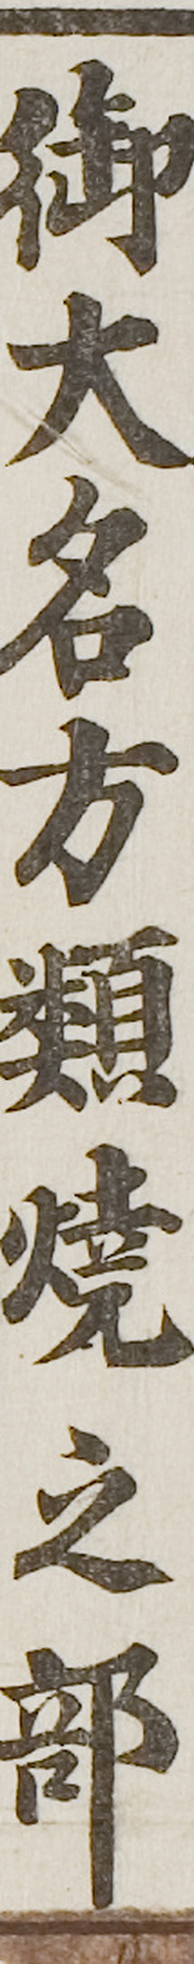御大名方類焼之部
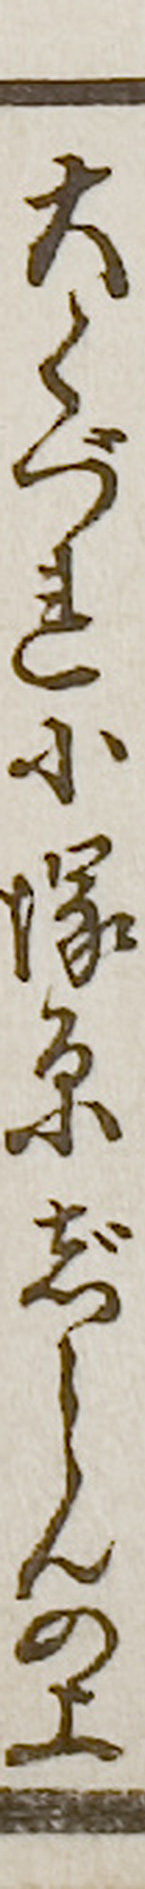大くづれ小塚原じしんの上
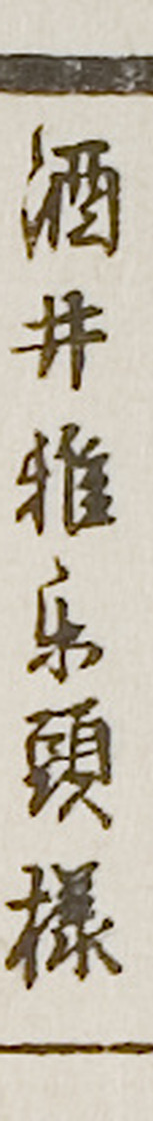酒井雅楽頭様
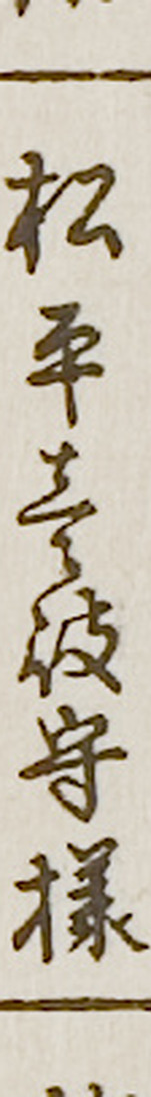松平壱岐守様
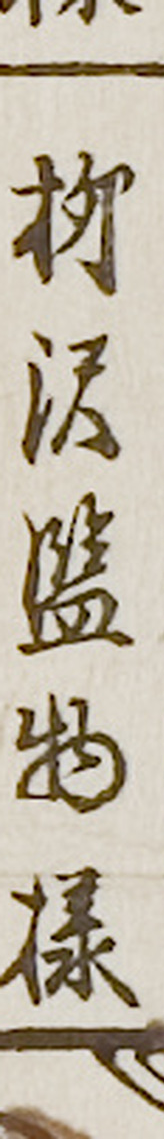栁沢監物様
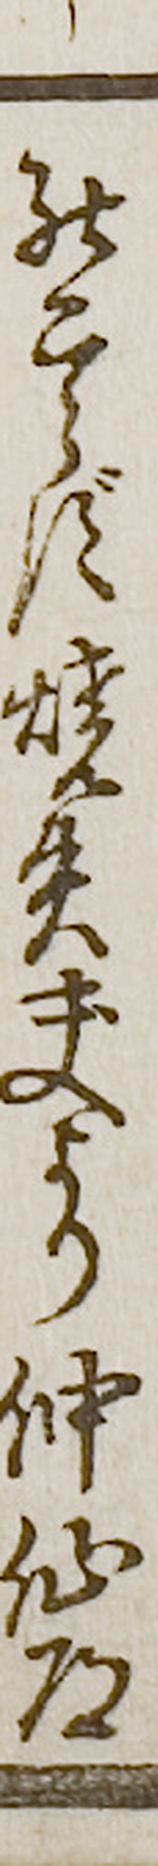のこらず焼失夫より仲仙道
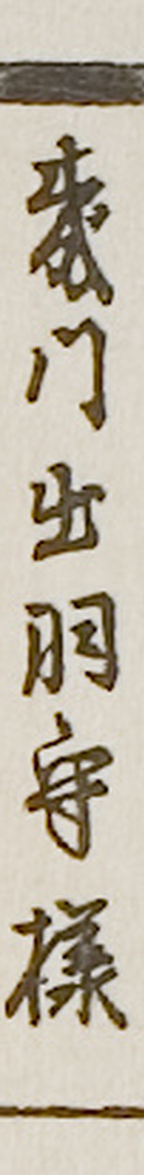森川出羽守様
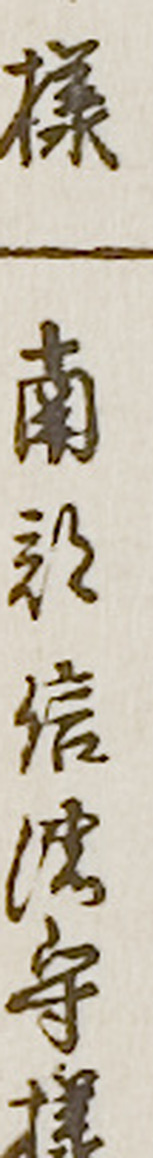南部信濃守様
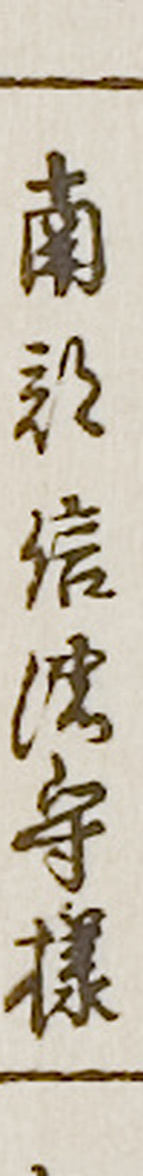南部信濃守様
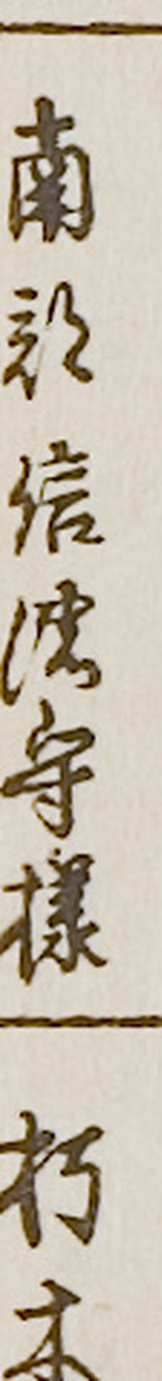南部信濃守様
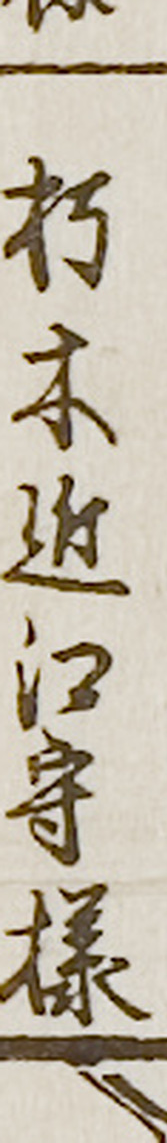朽木近江守様
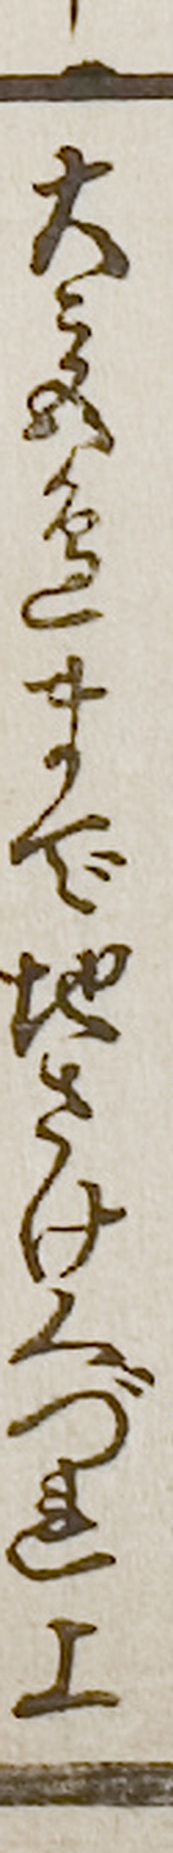大宮辺まで地さけくづれ上
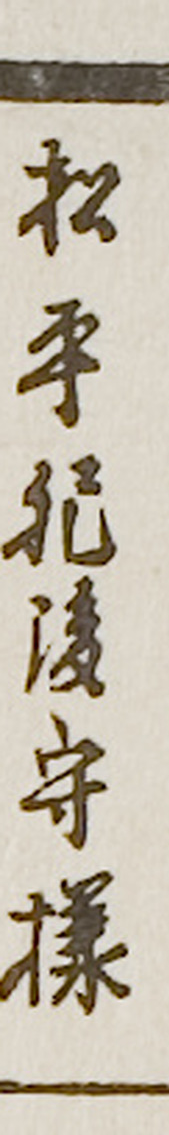松平肥後守様
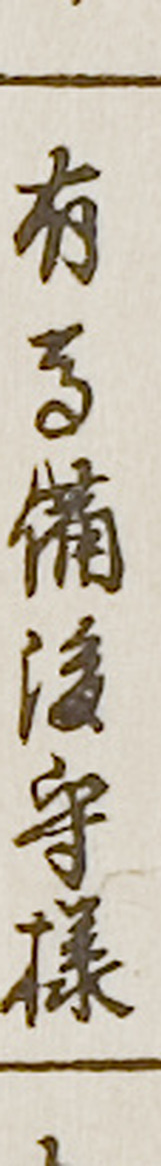有馬備後守様
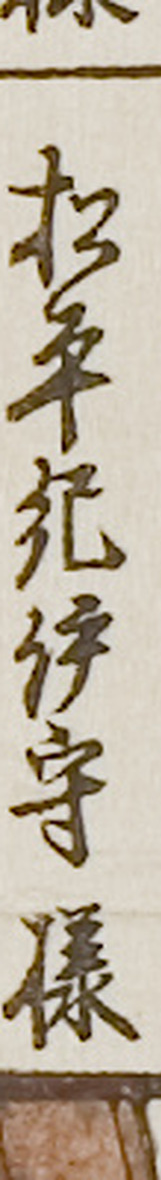松平紀伊守様
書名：安政二乙卯歳十月二日夜ル四ツ時震始メ末代
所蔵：東京大学総合図書館 General Library in the University of Tokyo, JAPAN
